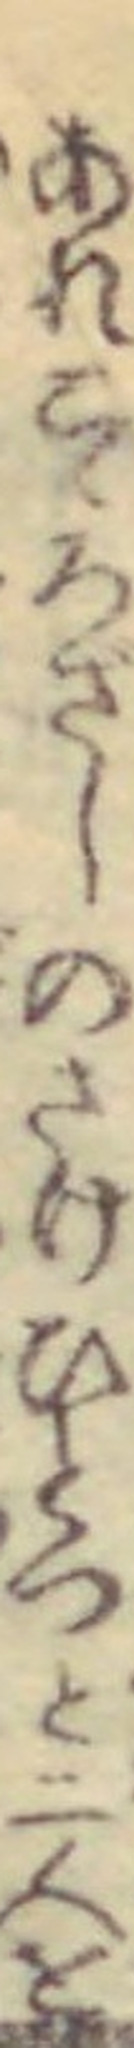あれこゝろざしのさけひとつと二人を
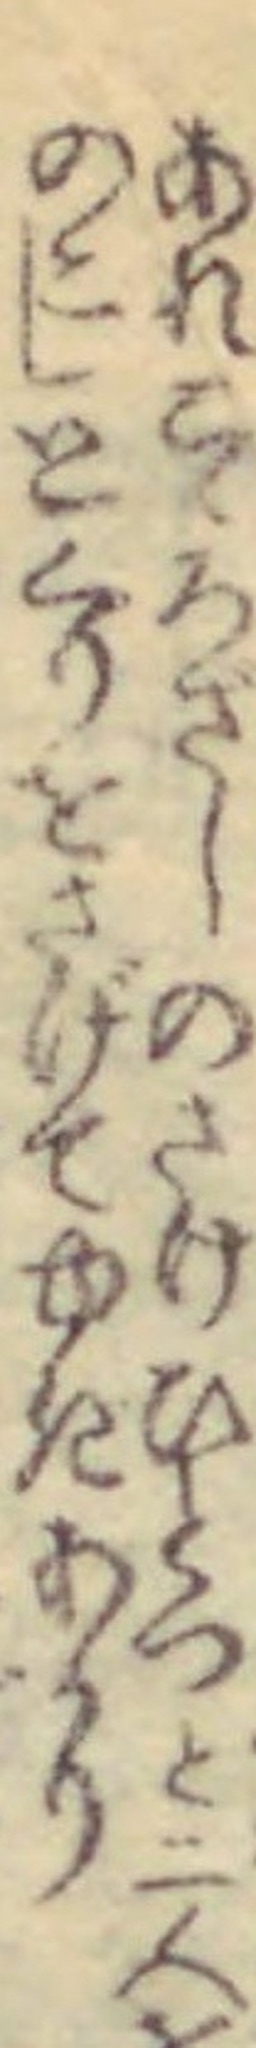のこしとくりをさげてゆきあかり
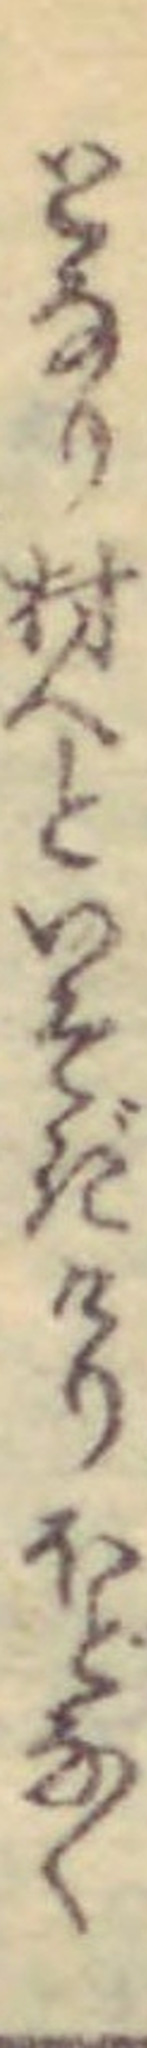となり村へといそぎけりほどなく
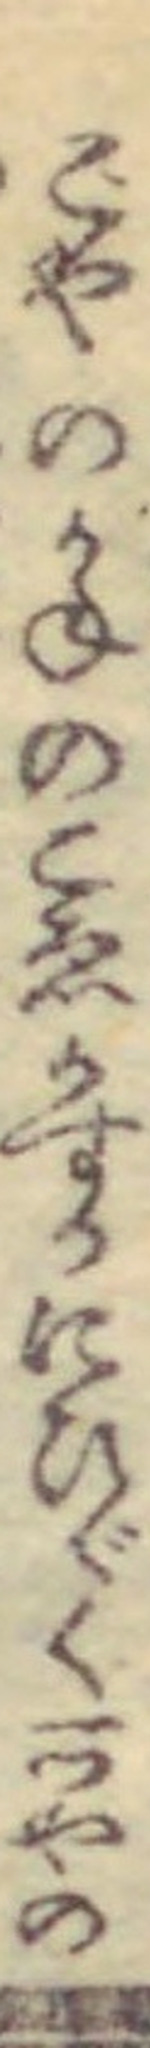ごやのかねのこゑかすかにひゞく一つやの
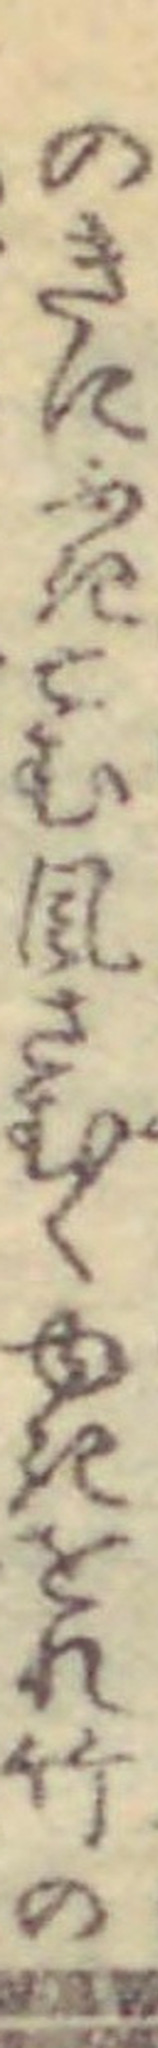のきにひきこむ風さむくゆきをれ竹の
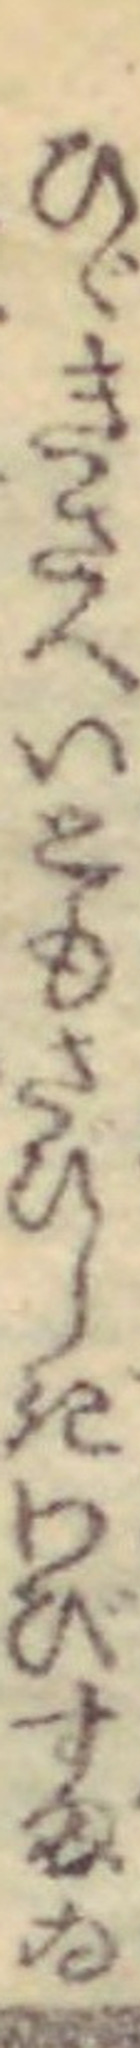ひゞきさへいともさひしきわびすまゐ
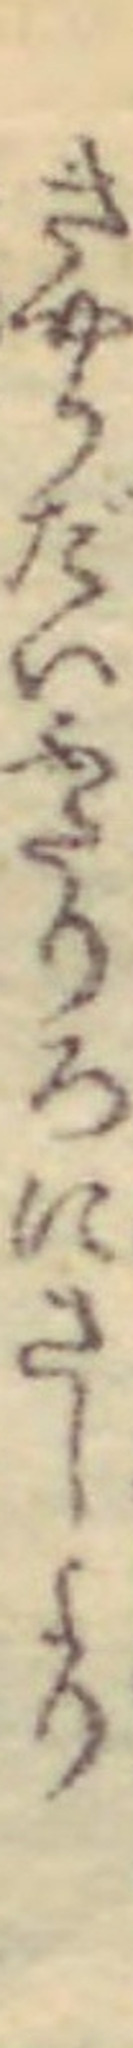きやうだいふたりろにさしより
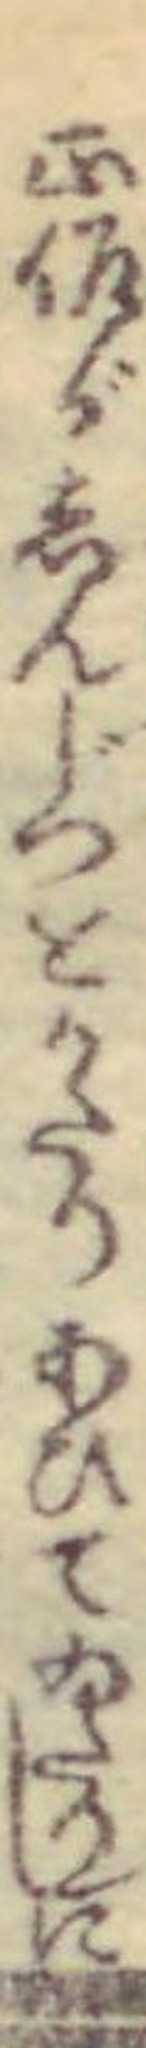正作がしんじつをかたりあひてゐたりしに
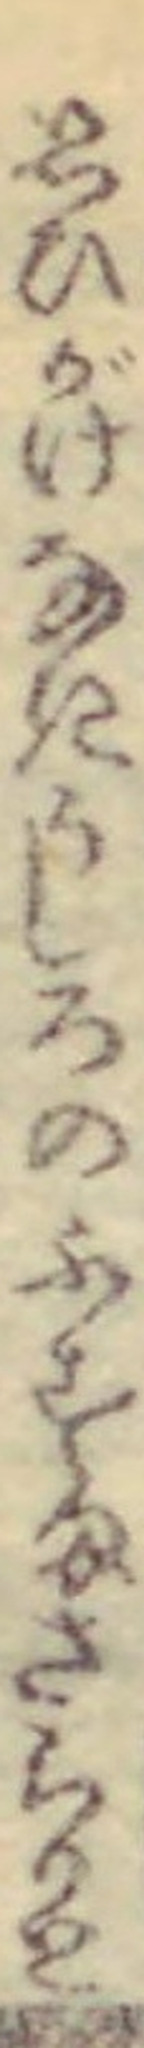思ひがけなきにうしろのふすまさらりと
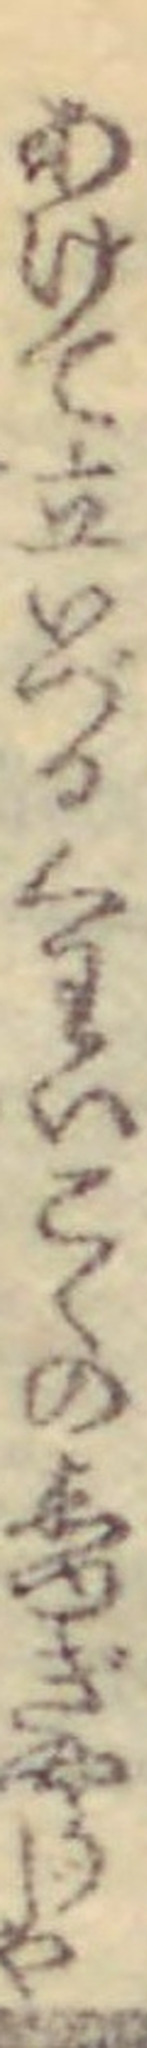あけて立いづるくわいこくのしゆぎやうじや
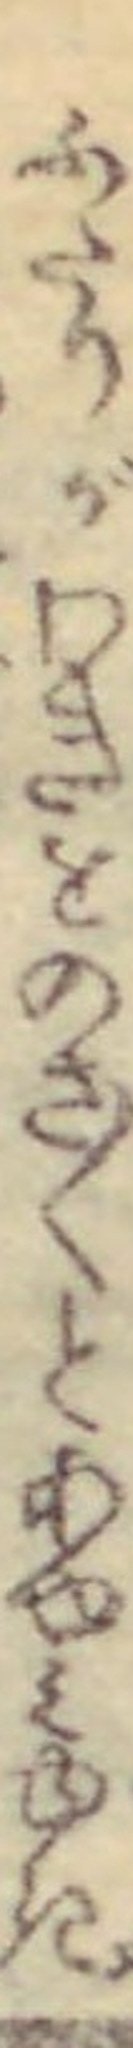ふたりがわきをのさ〳〵とあゆみゆき
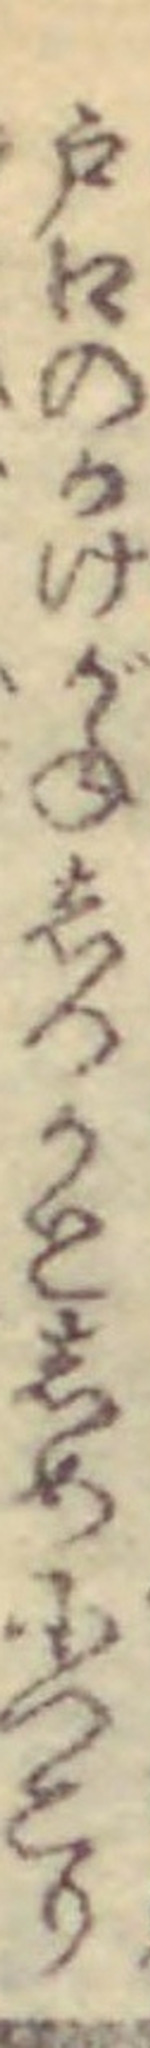戸口のかけがねしつかとしめにつこり
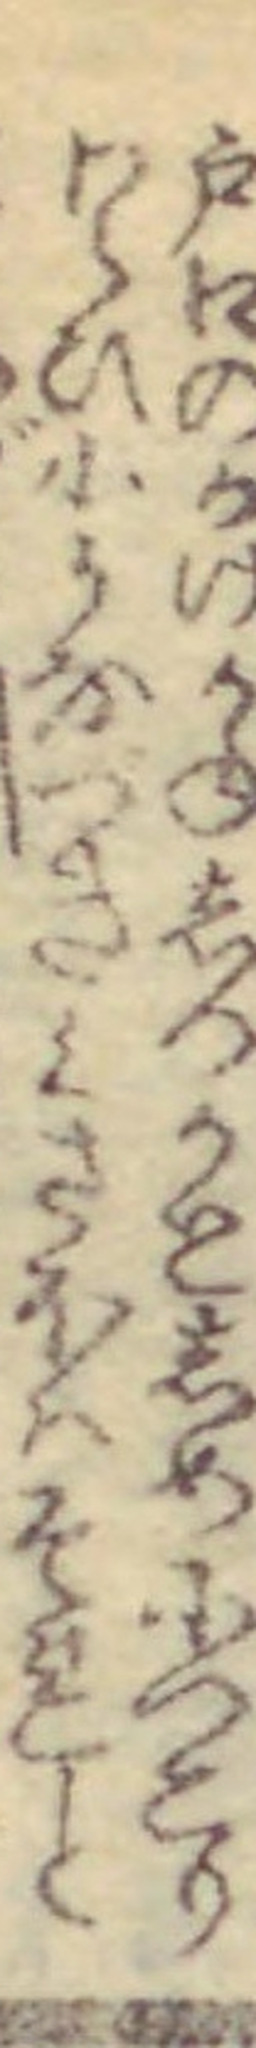わらひにうなづきみさほはそれと
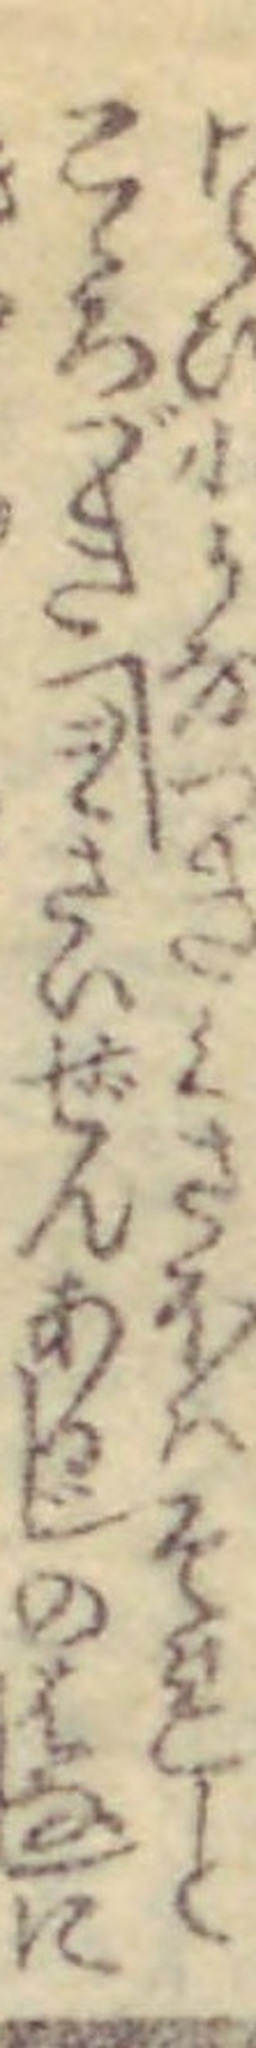こゝろづき〽ヲヽさいぜんあるじのはなしに
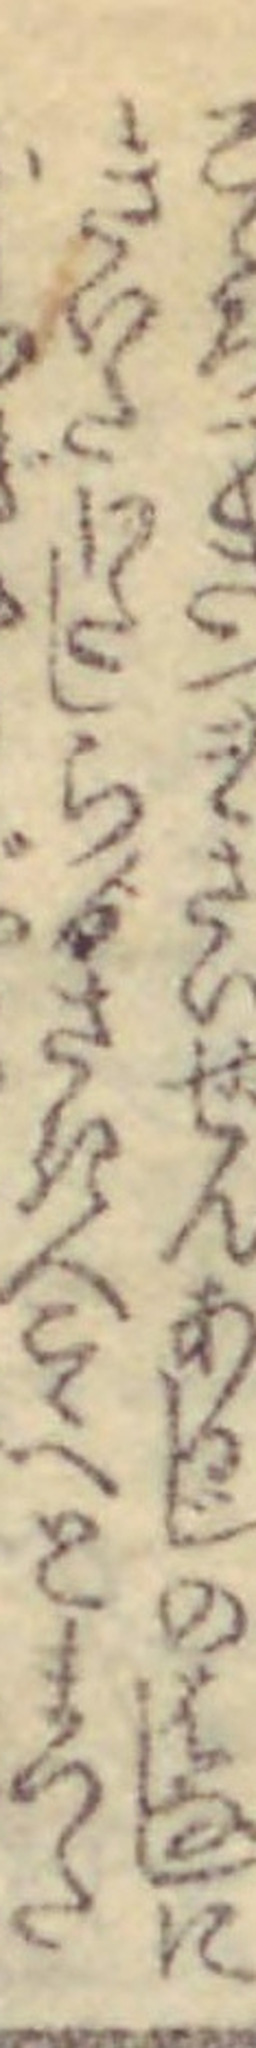きいたわたしらよりさきへこゝへとまつた
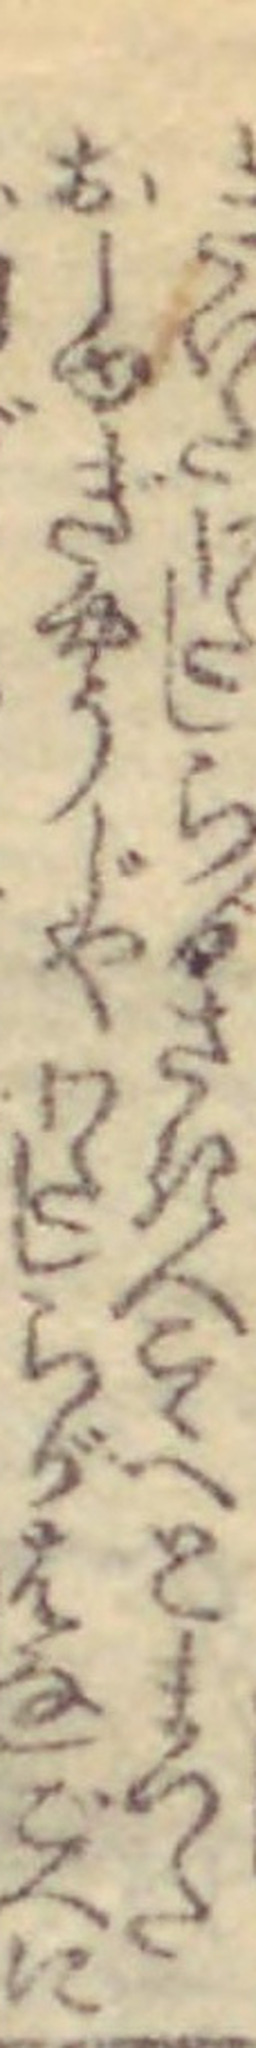おしゆぎやうじやわたしらがはなしごへに
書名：八ツ目鱣因縁物語 3巻
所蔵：国立国会図書館 National Diet Library, JAPAN
